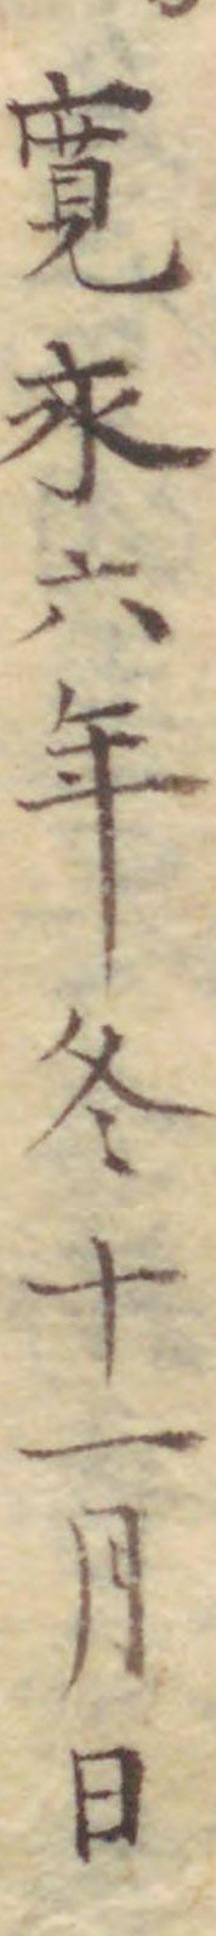寛永六年冬十一月日
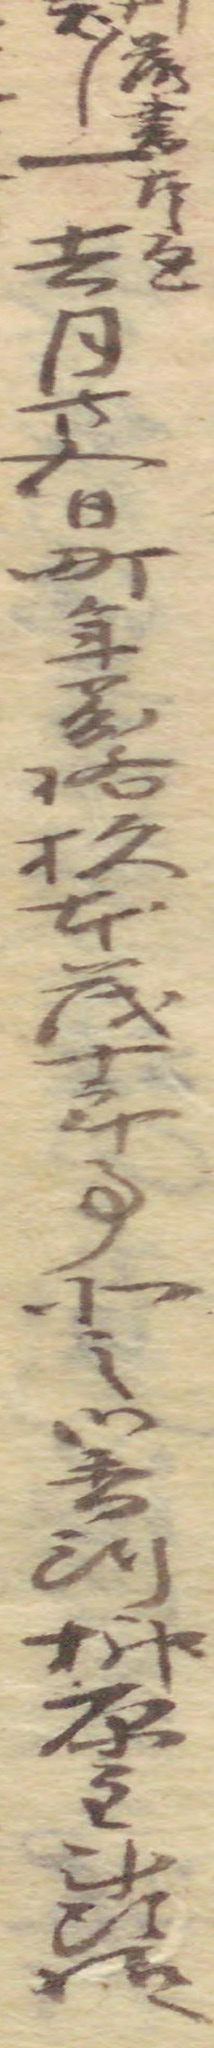一去月廿五日町年寄格杦本茂十郎事北之御番所榊原主計頭様へ
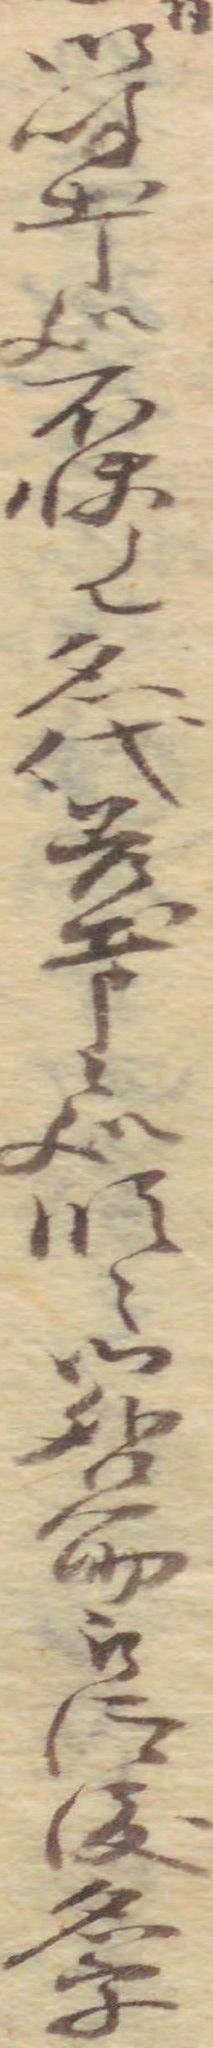御呼出之所不快ニて名代差出申候処段〻御咎筋被仰渡名字
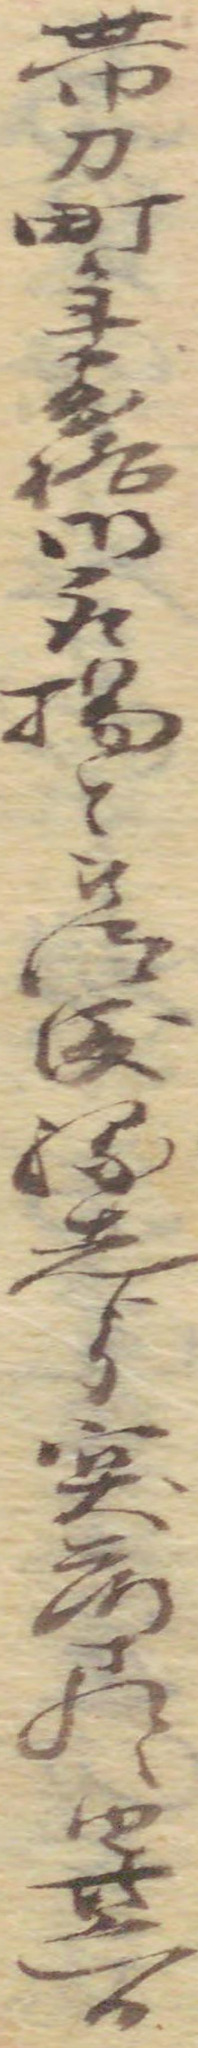帯刀町年寄格御取揚と被仰渡縁先より突落され候由廿六日
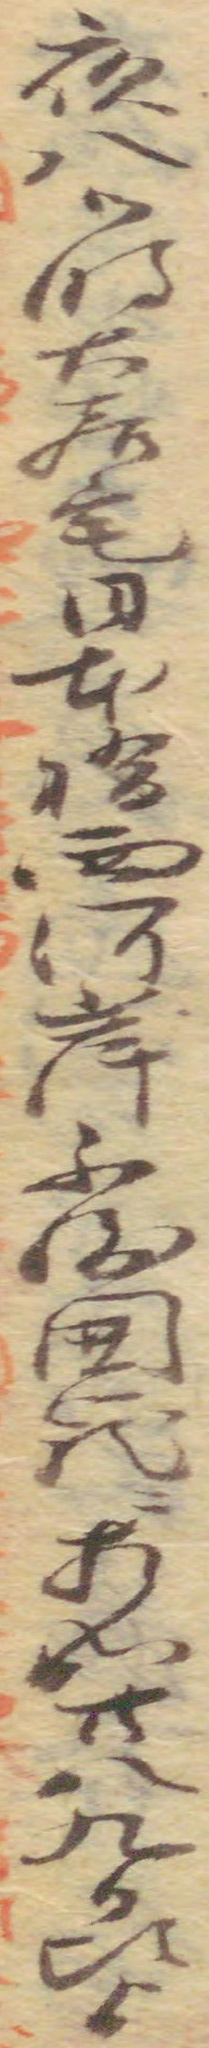夜八ツ時右居宅日本橋西河岸不残囲籠ニ相成廿八九日比ゟ

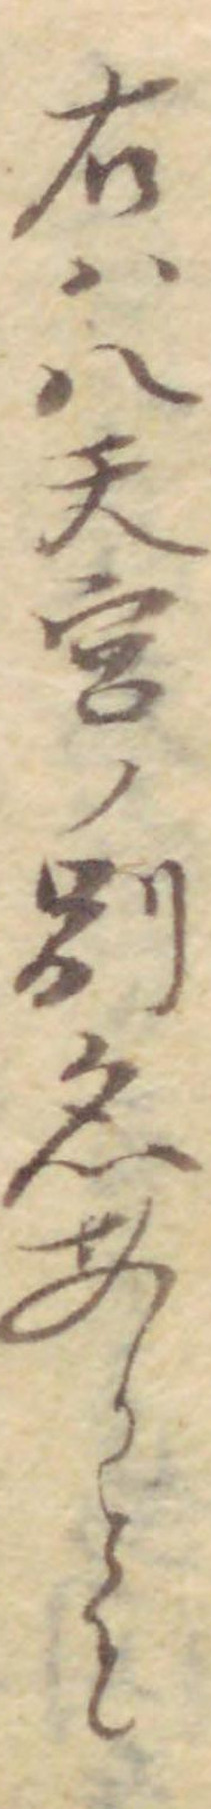右八天宮ノ別名なりとも

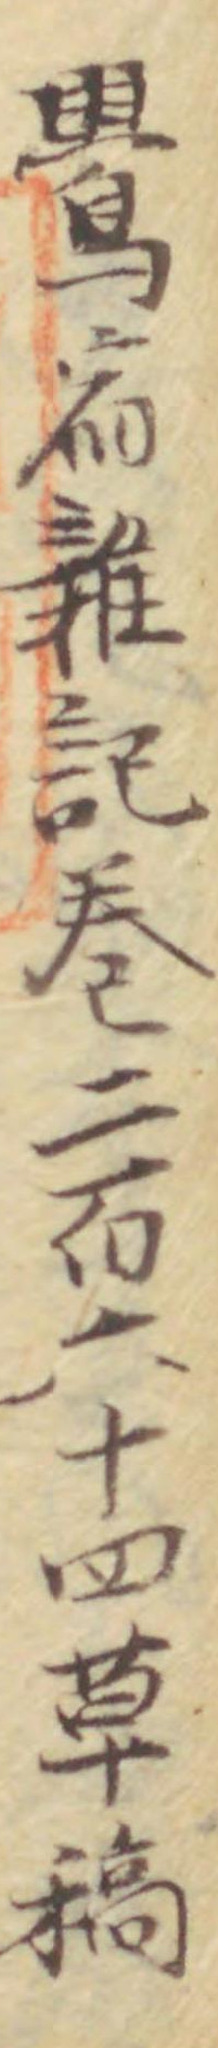鶯宿雑記巻二百六十四草稿
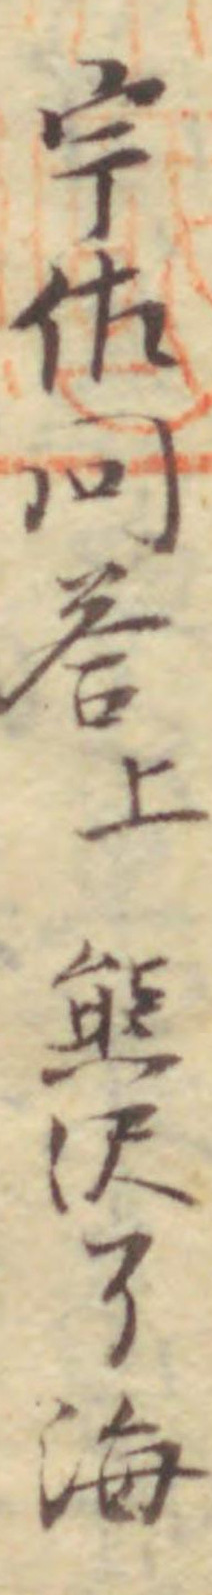宇佐問答上熊沢了海
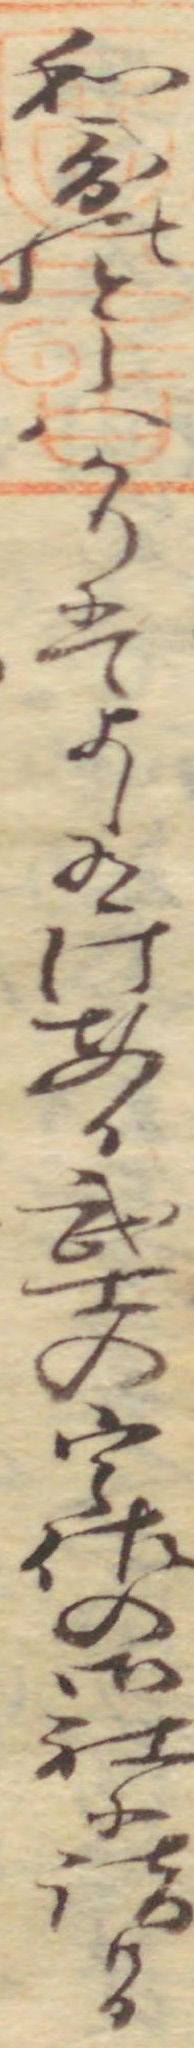和歌のとしはかりにてよし有けなる武士の宇佐の御社に詣ける
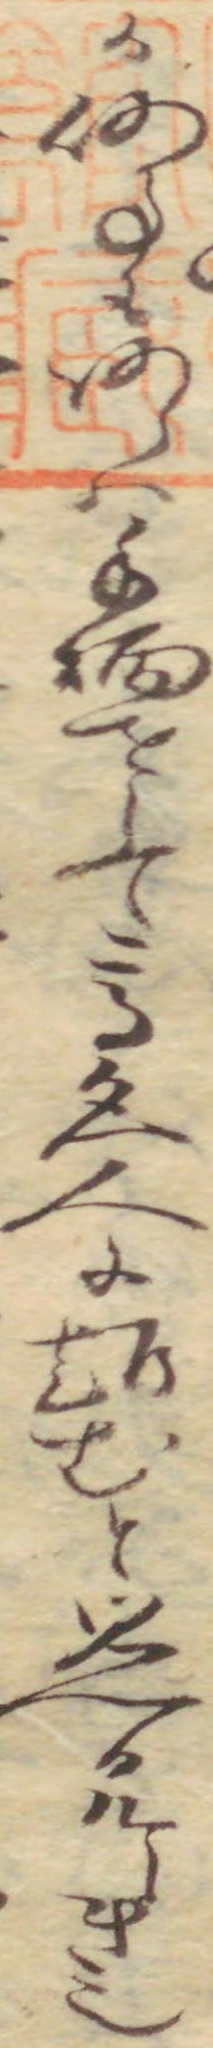か何事もあらは手柄をして高名人に越むと思へるけしき也
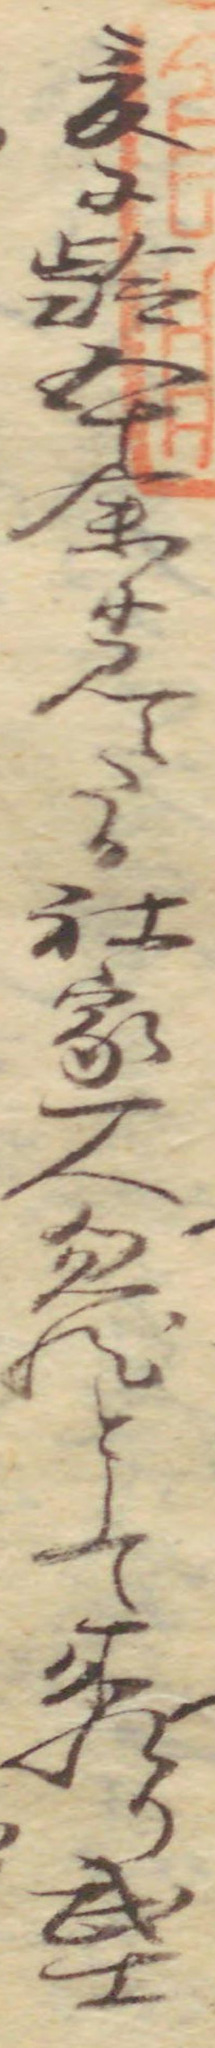爰に齢五十余に見えたる社家一人忽然として来れり武士
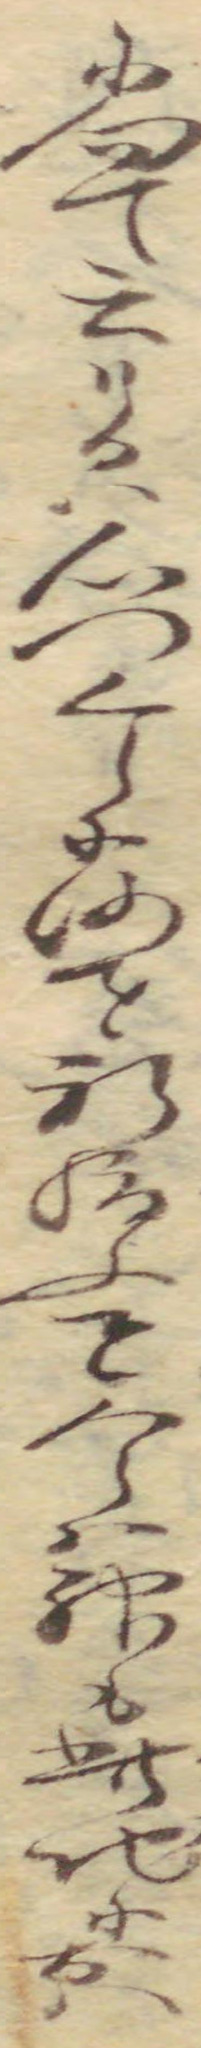に向て云けるは心つくしに何を祈給ふそ今は神も此地にはおは
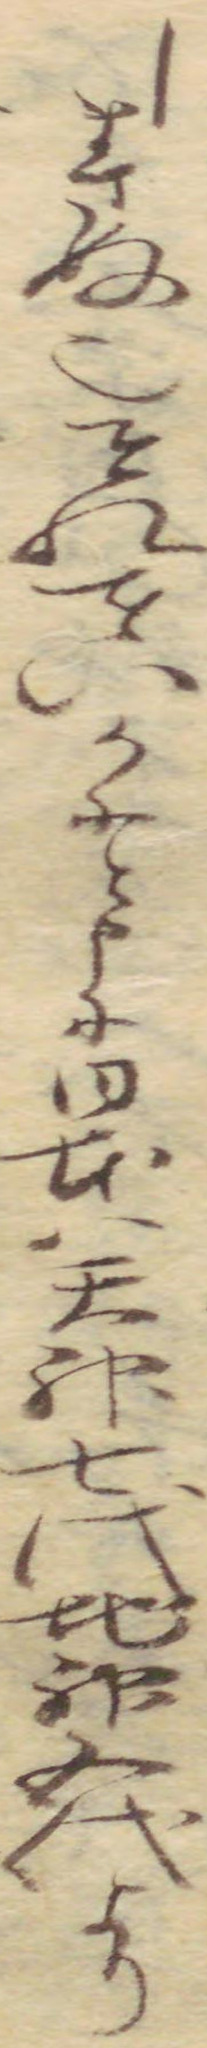しまさぬ也それをいかにと申に日本は天神七代地神五代より
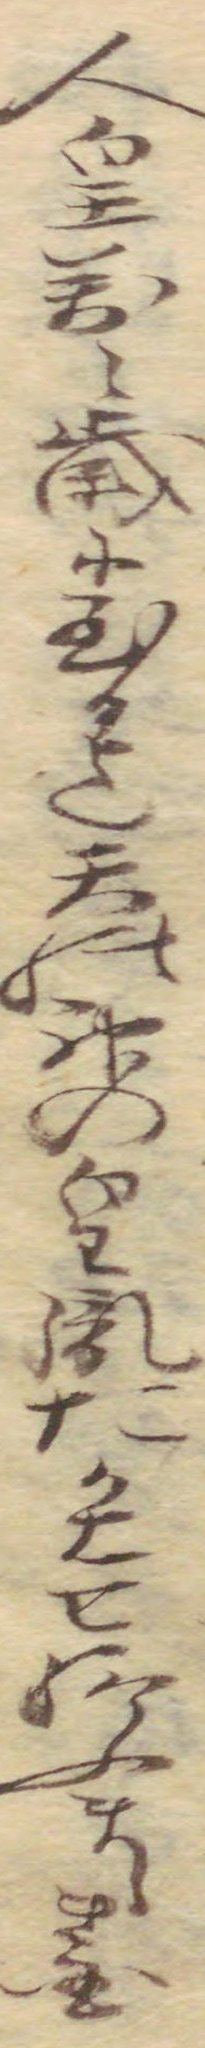人皇万〻歳に至る迄天の神の皇胤たかはせ給ふましき国
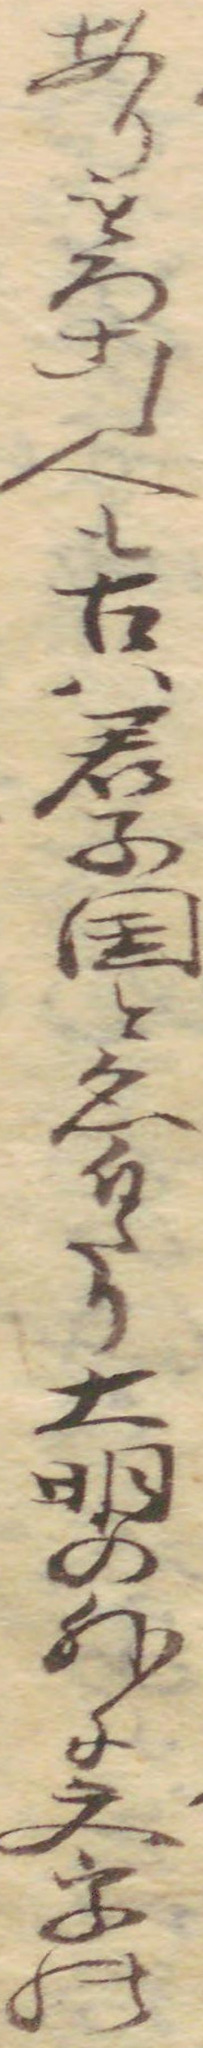なりもろこし人も古は君子国と名付たり大明の外に文字の
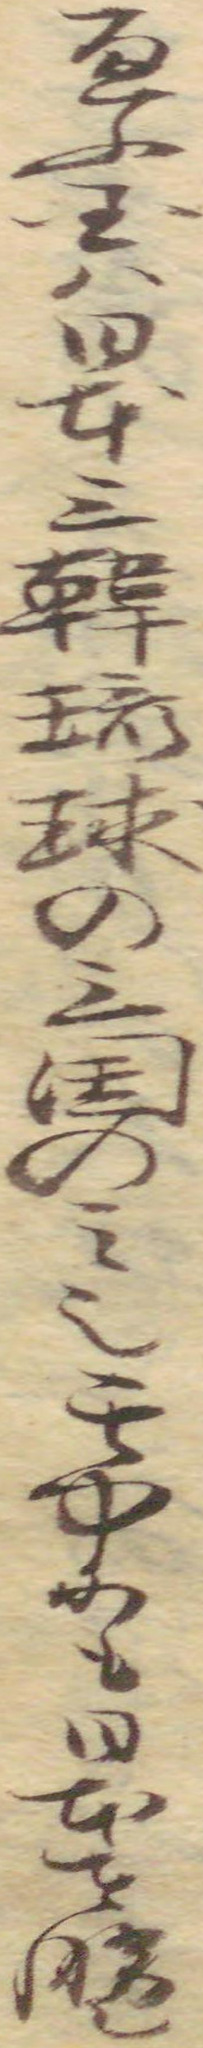通ふ国は日本三韓琉球の三国のみ也其中にも日本を勝レ
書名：鶯宿雑記. 巻263-264
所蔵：国立国会図書館 National Diet Library, JAPAN
